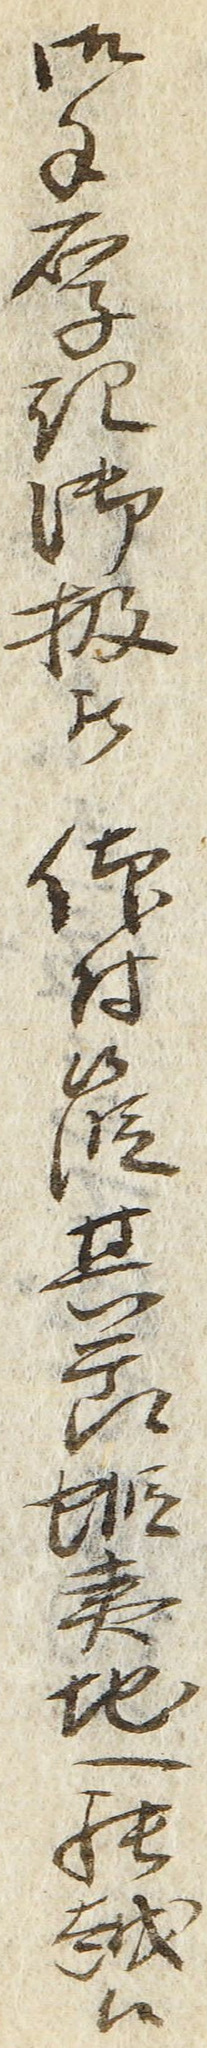御手厚き御扱被仰付候段其節蝦夷地へ罷越候
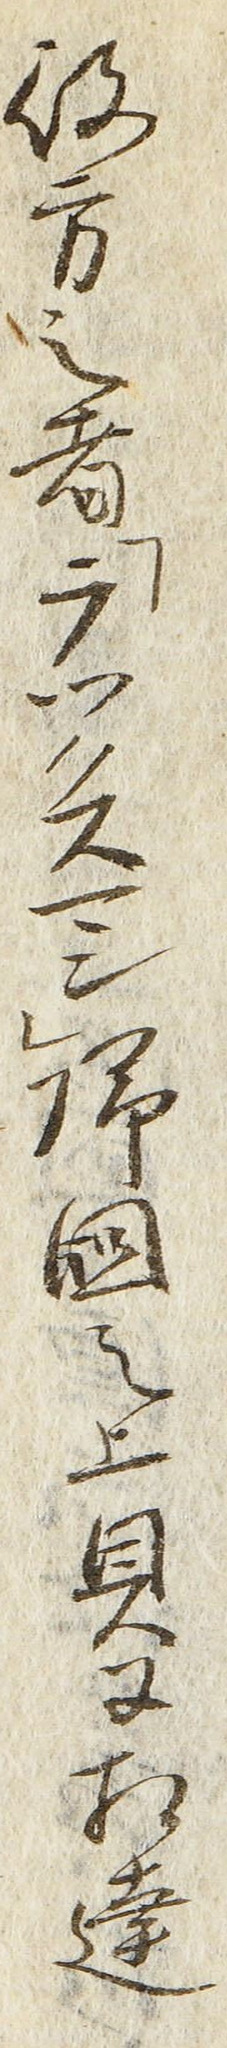役方之者「ラツクスマン」帰国之上具に相達
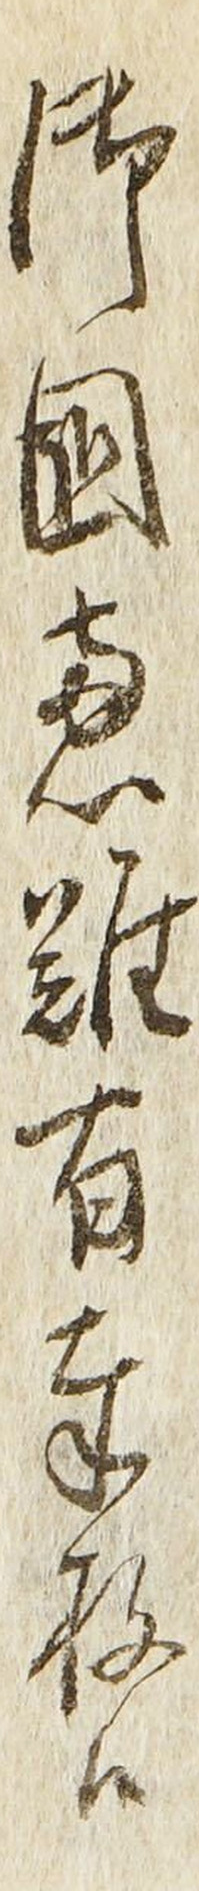御国恵難有奉存候
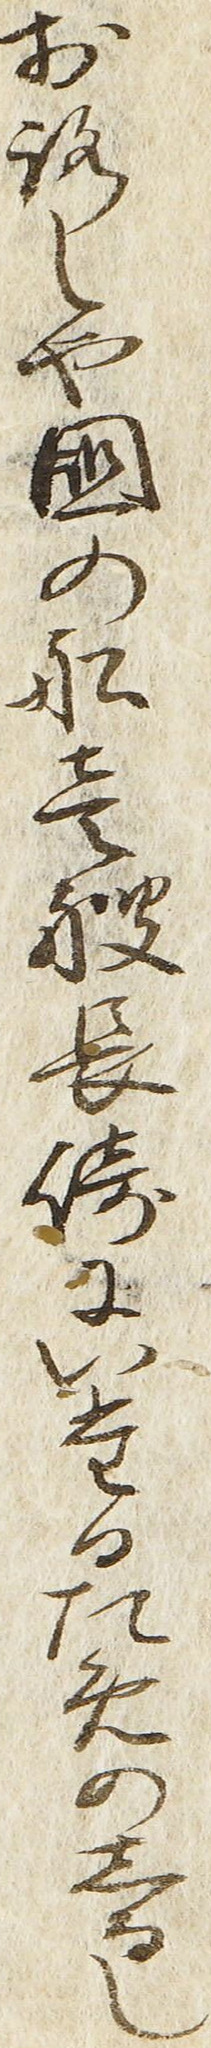おろしや国の船壱艘長崎にいたるためのしるし
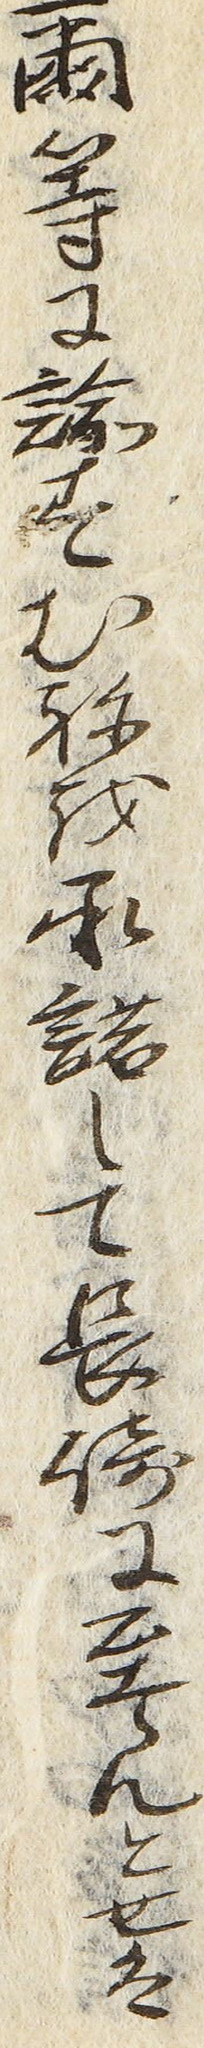爾等に諭すむねを承諾して長崎に至らんとせは
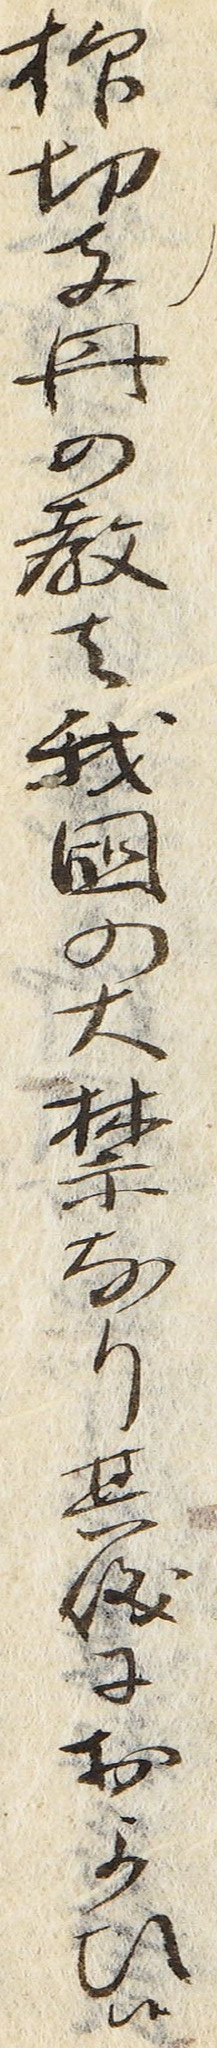抑切支丹の教は我国の大禁なり其儀におよひ候
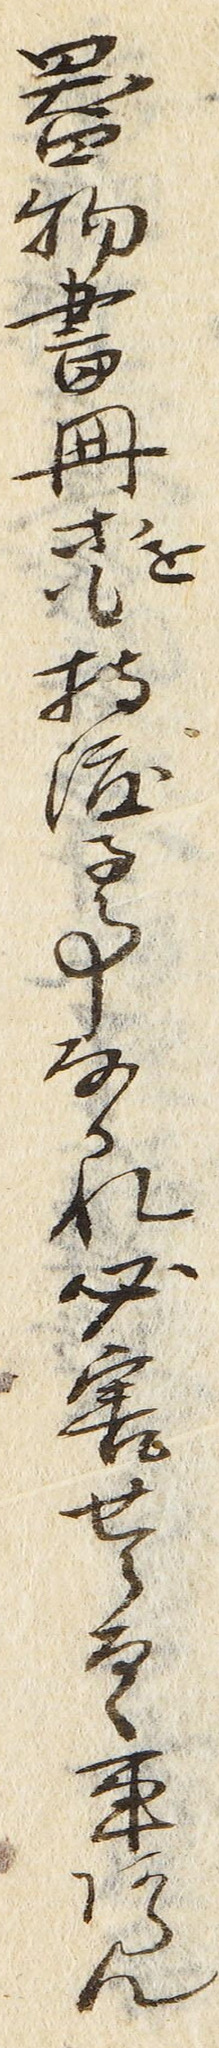器物書冊等をも持渡る事なかれ必害せらるゝ事あらん
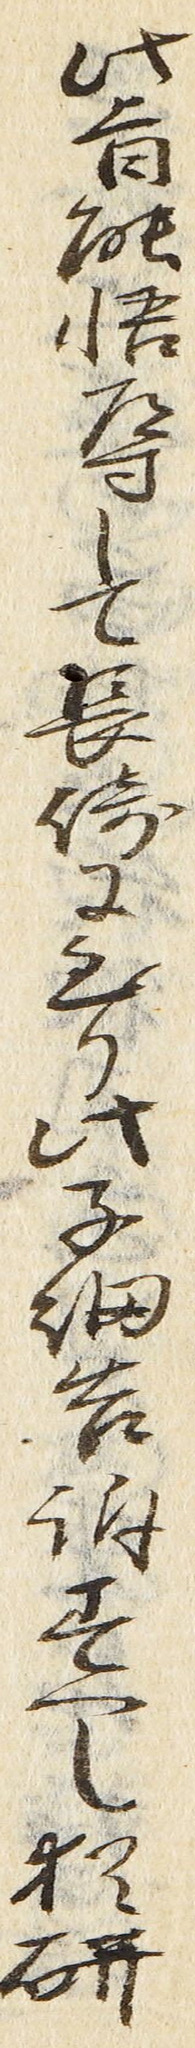此旨能悟導して長崎に至り此子細告訴すへし猶研
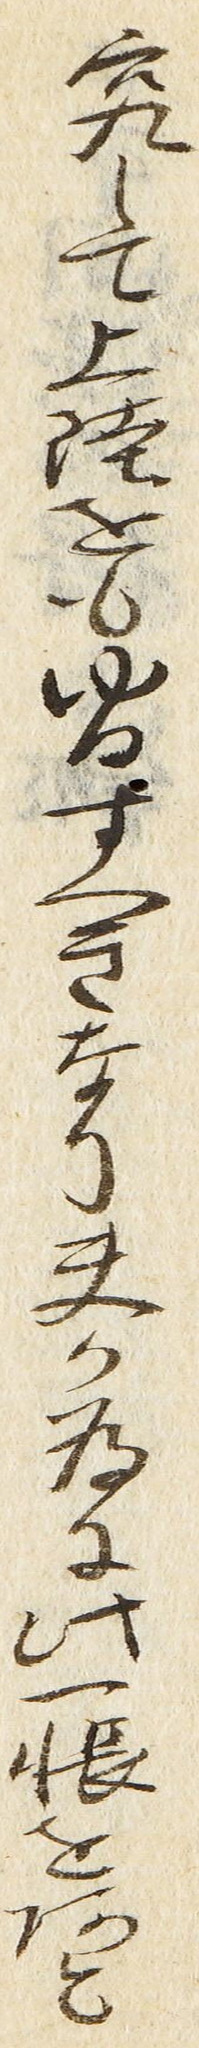究して上陸をもゆるすへきなり夫か為に此一帳をあと
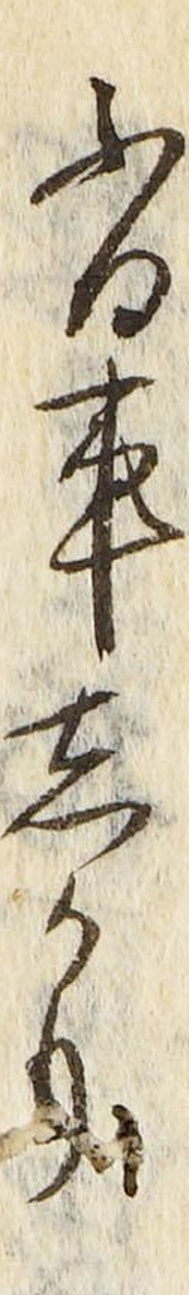ふる事しかり
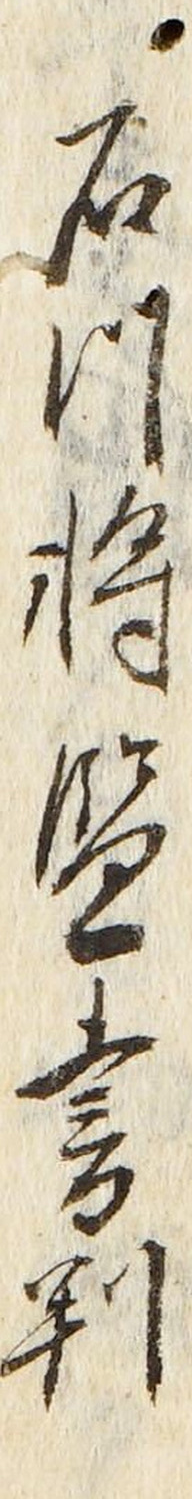石川将監書判
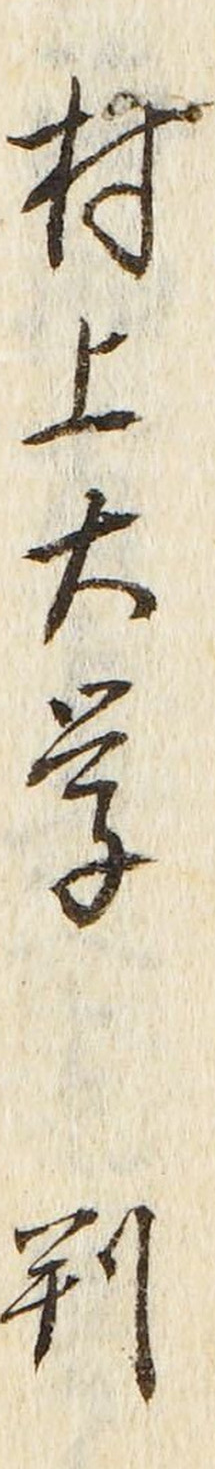村上大学判
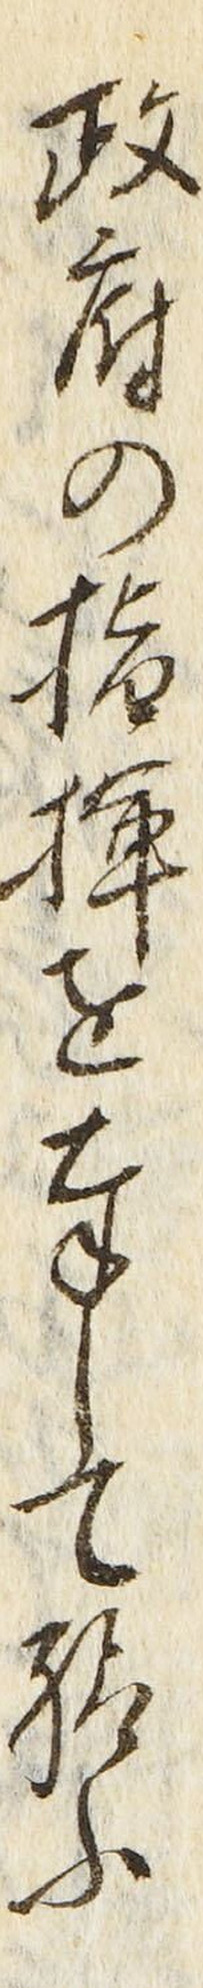政府の指揮を奉して給ふ
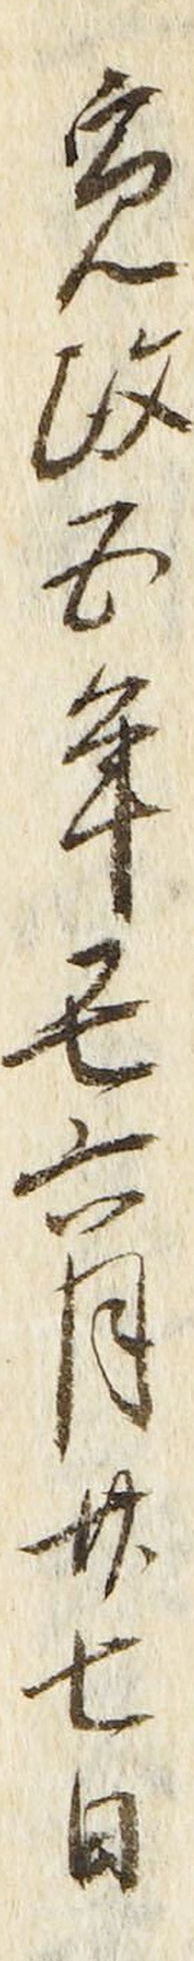寛政五年丑六月廿七日
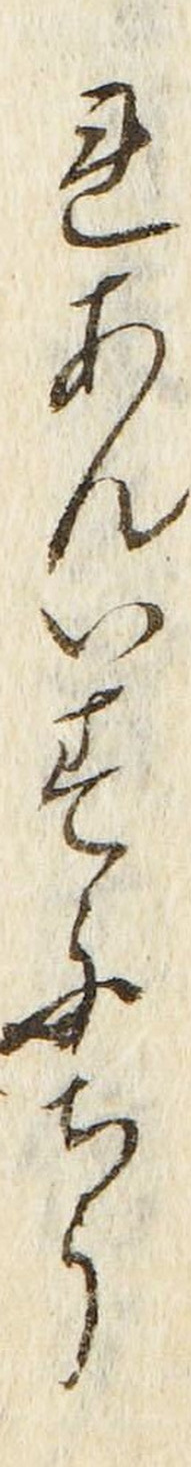れあんいすふちう
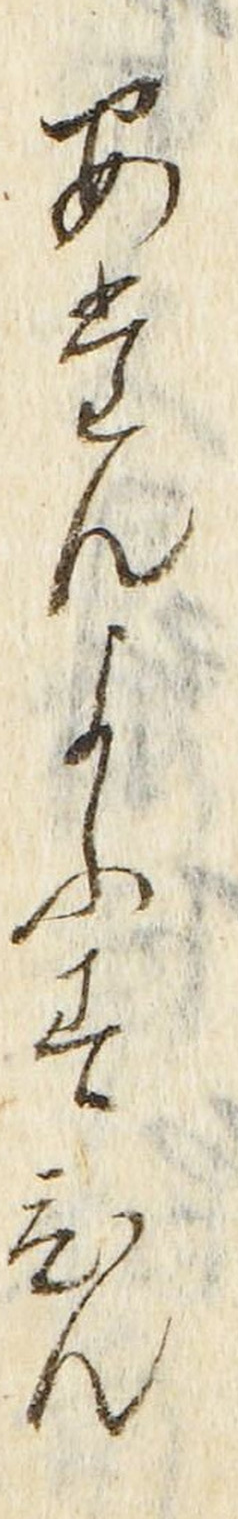あたんよふすひん
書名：漂民後記
